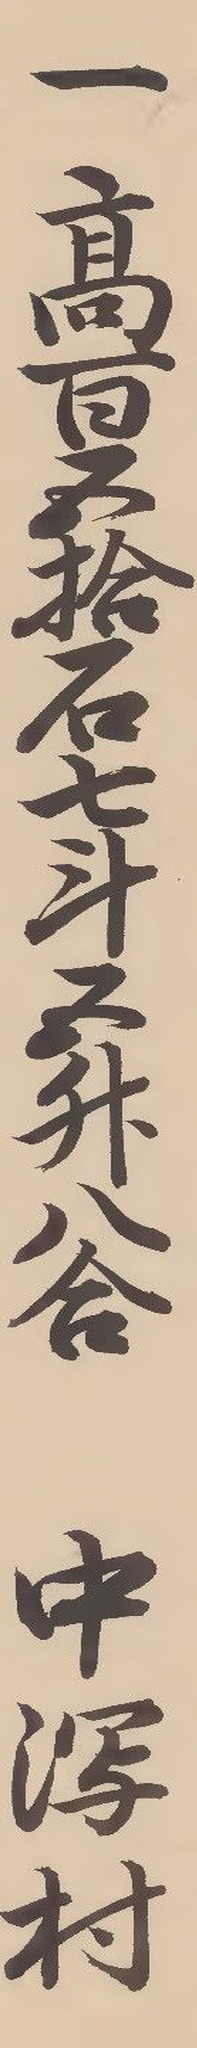一高百五拾石七斗五升八合中潟村
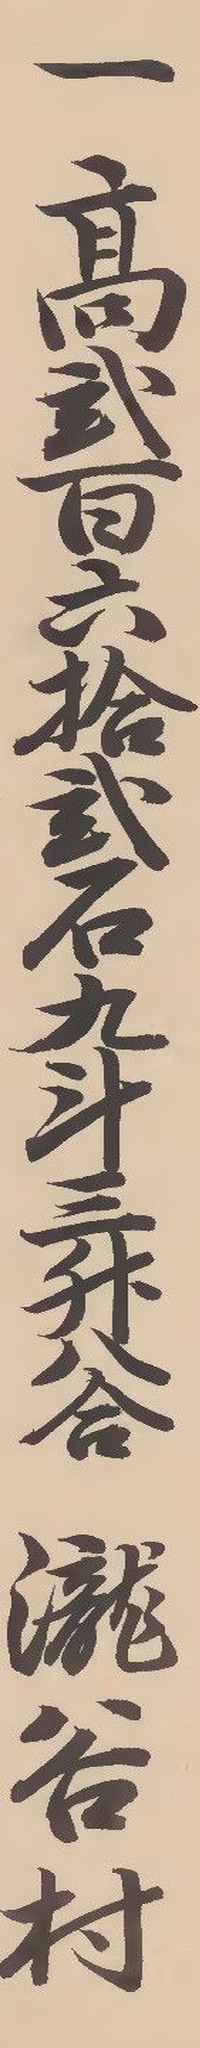一高弐百六拾弐石九斗三升八合滝谷村
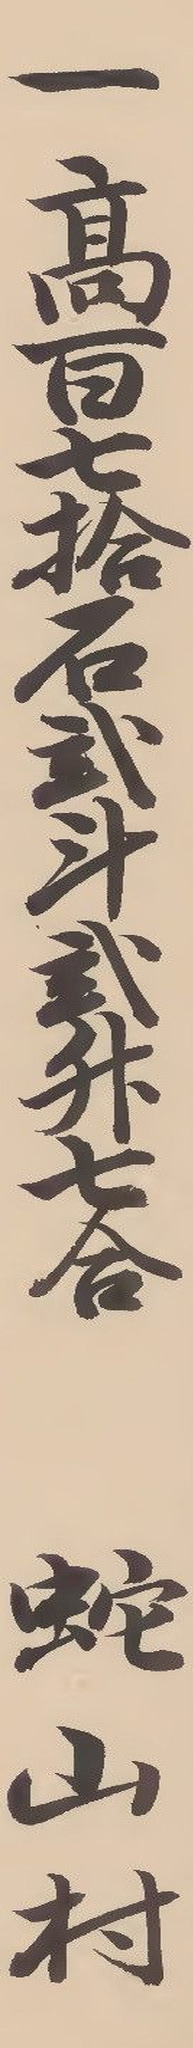一高百七拾石弐斗弐升七合蛇山村
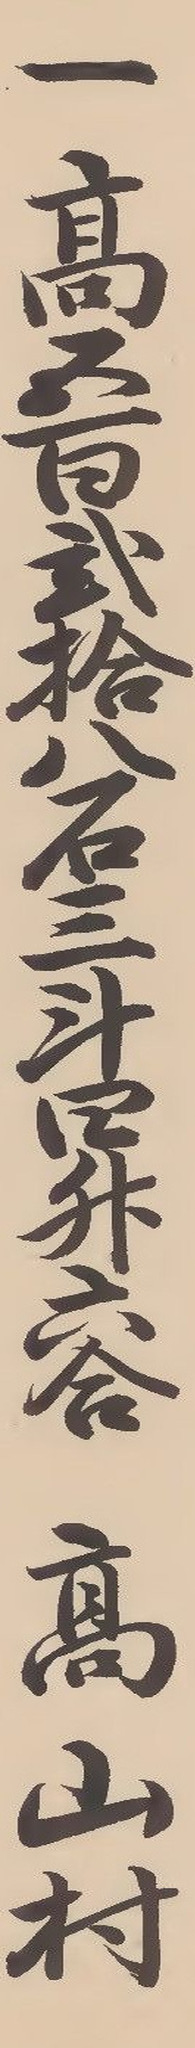一高五百弐拾八石三斗四升六合高山村
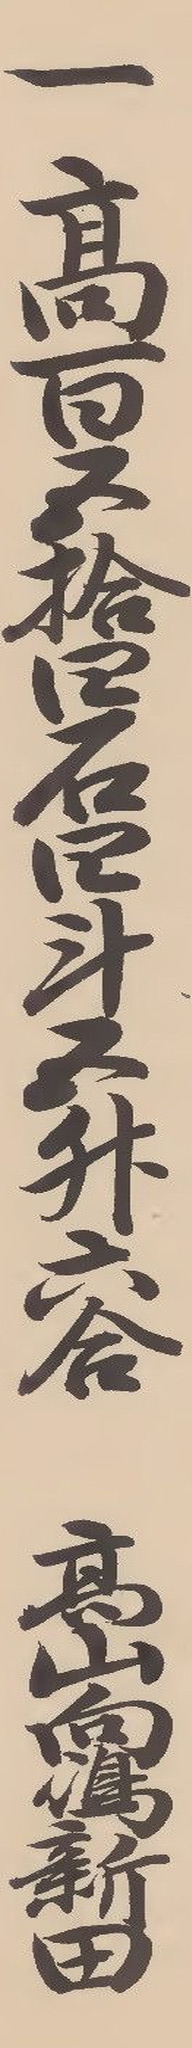一高百五拾四石四斗五升六合高山向島新田
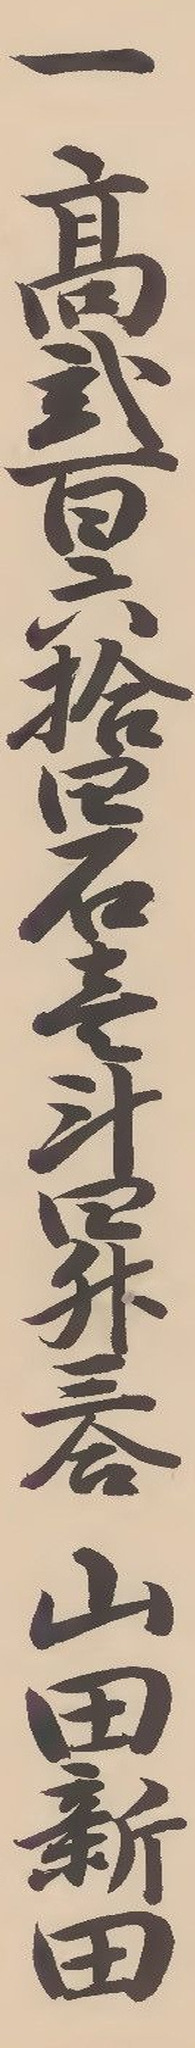一高弐百六拾四石壱斗四升三合山田新田

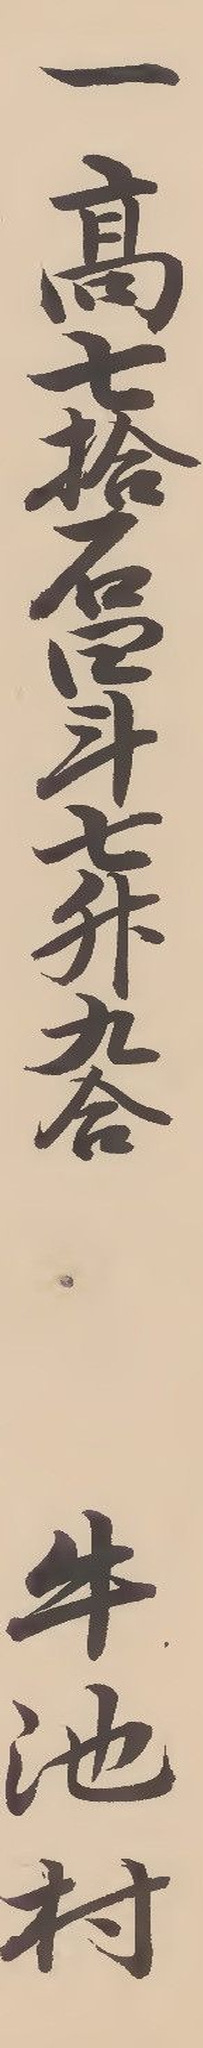一高七拾石四斗七升九合牛池村
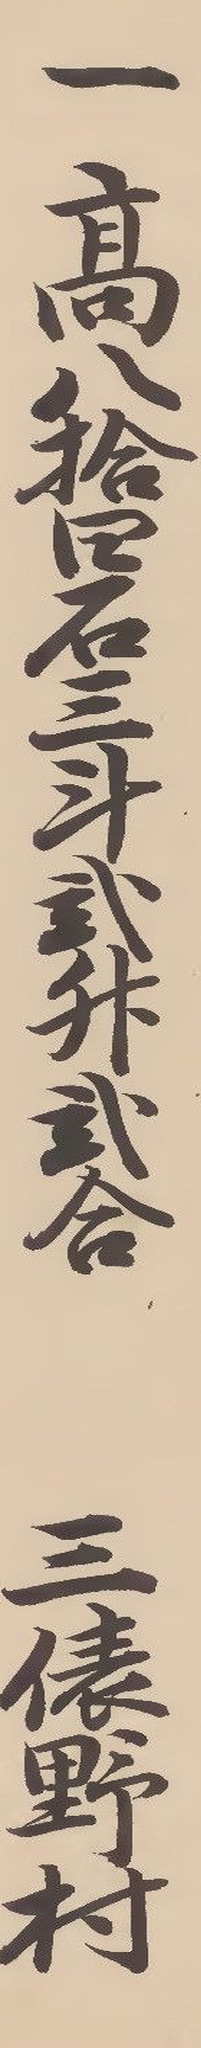一高八拾四石三斗弐升弐合三俵野村
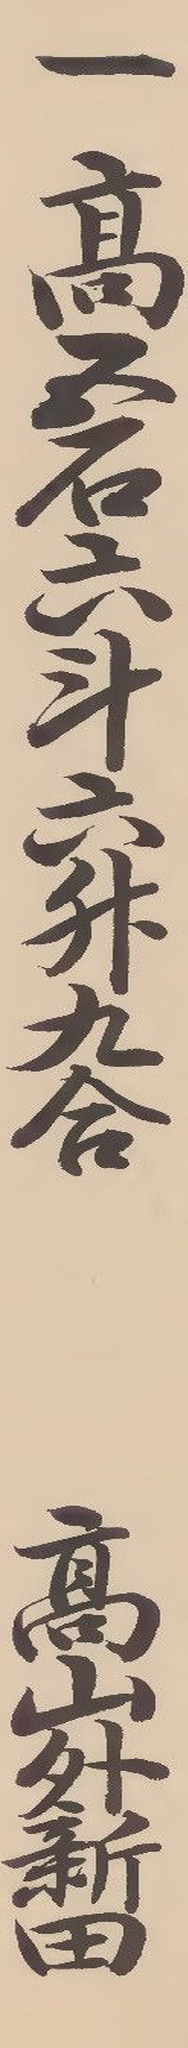一高五石六斗六升九合高山外新田
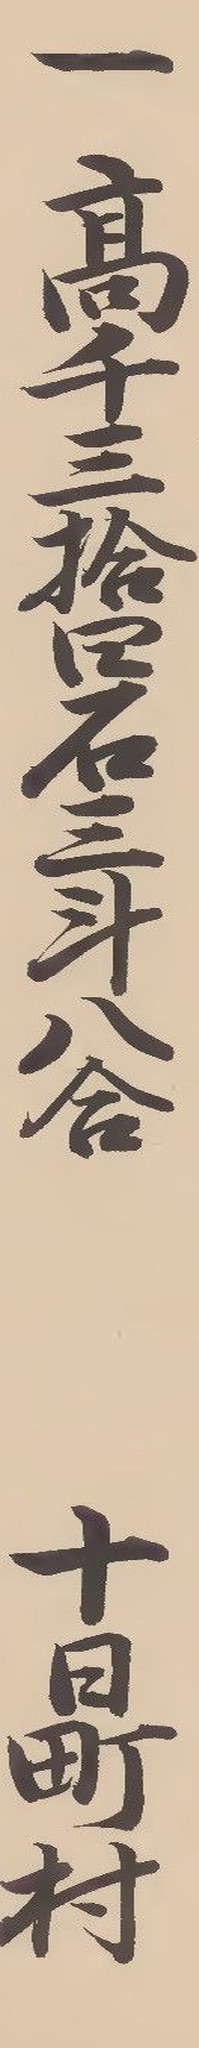一高千三拾四石三斗八合十日町村
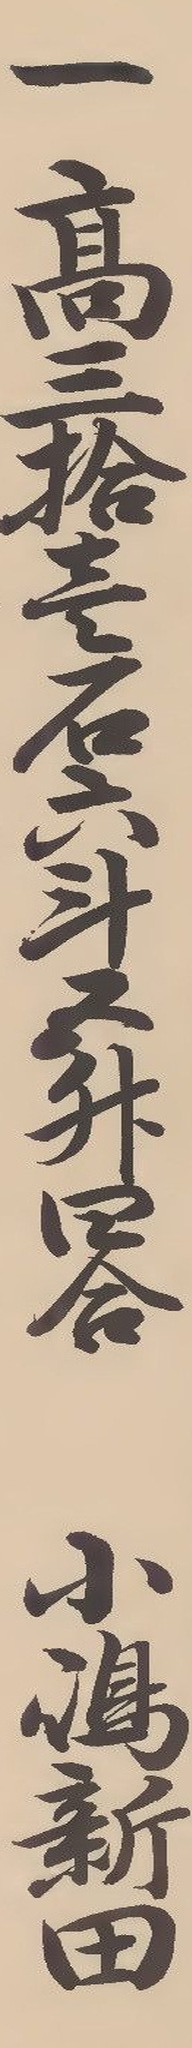一高三拾壱石六斗五升四合小島新田
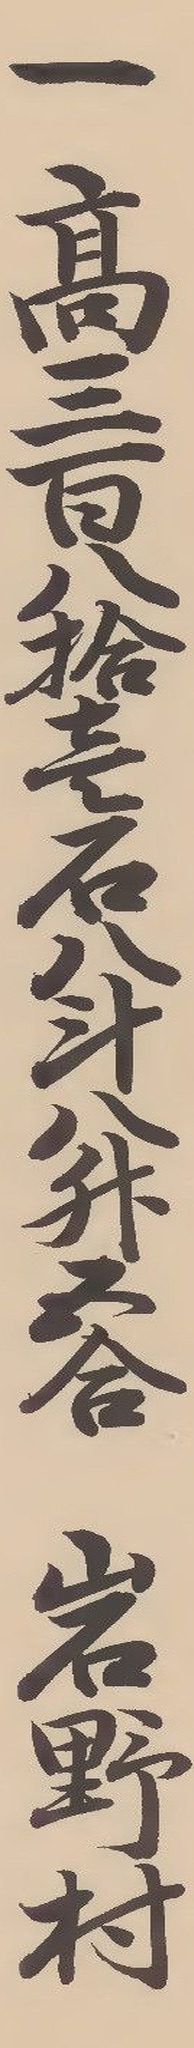一高三百八拾壱石八斗八升五合岩野村
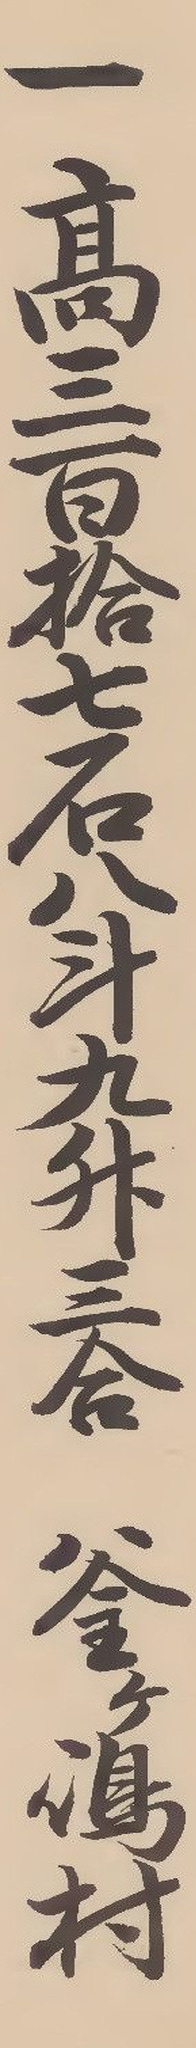一高三百拾七石八斗九升三合釜ヶ島村

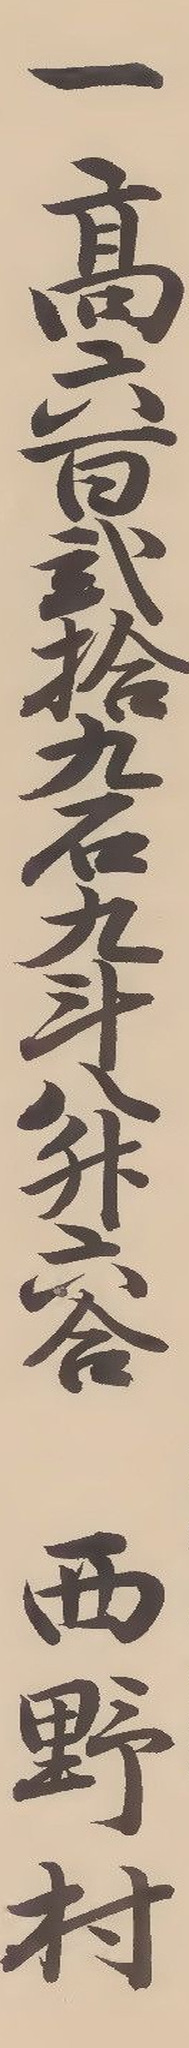一高六百弐拾九石九斗八升六合西野村
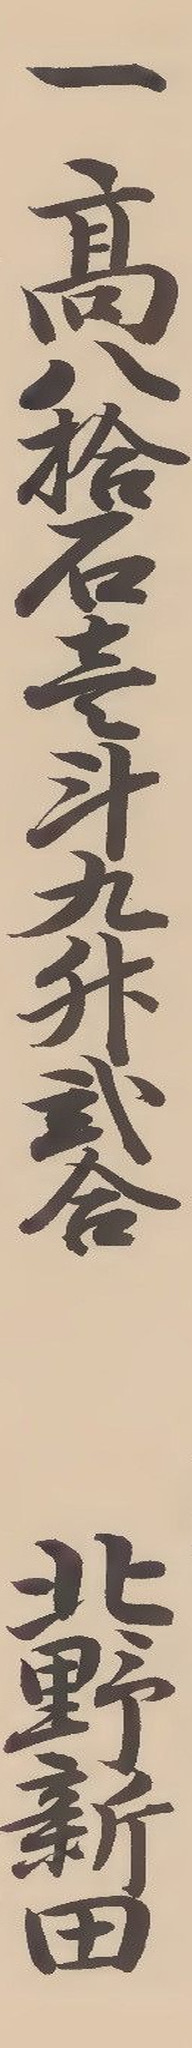一高八拾石壱斗九升弐合北野新田
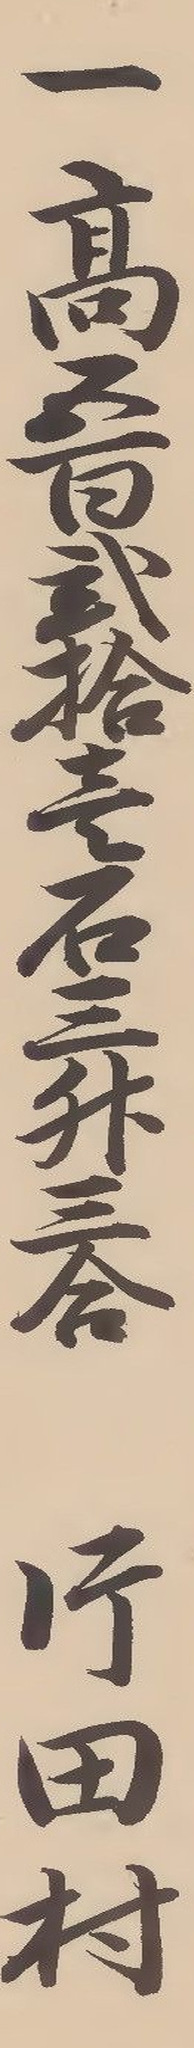一高五百弐拾壱石三升三合片田村
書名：越後国郷帳　中
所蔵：国立公文書館 National Archives of Japan
